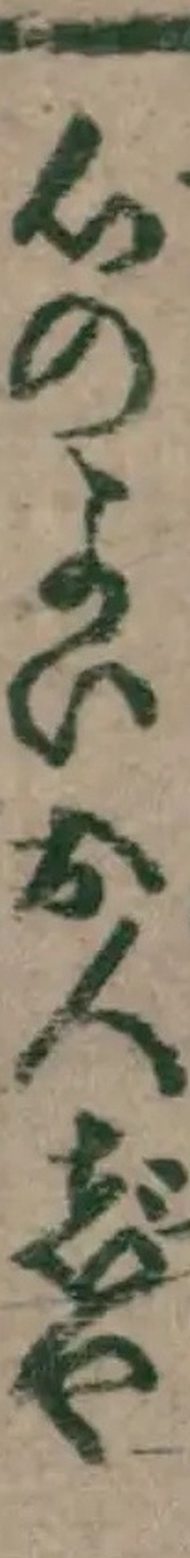心のよいお人じや
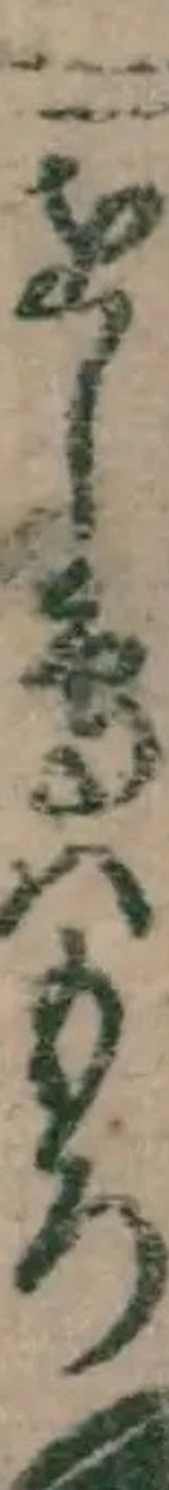をし鳥はもろ
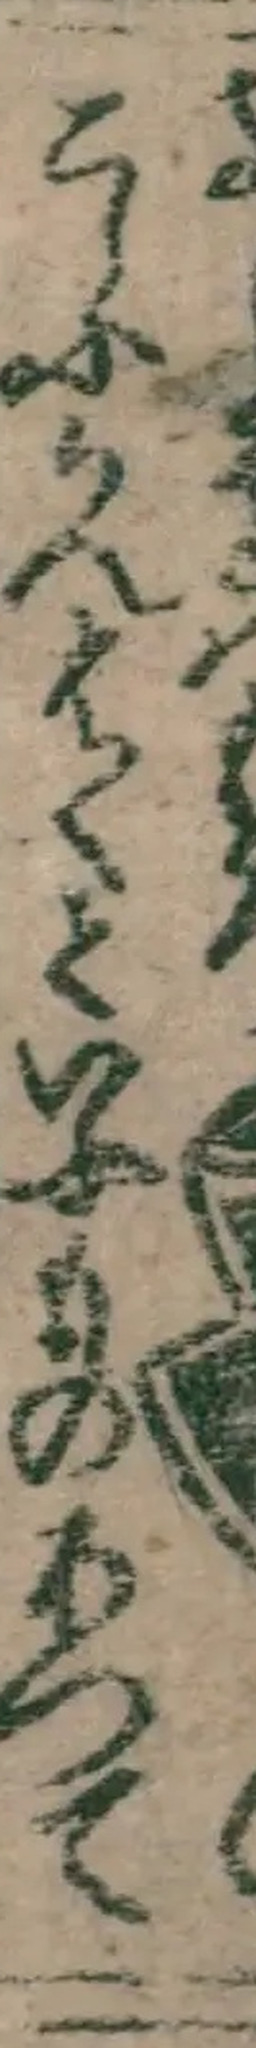こしにかんはくといふものあつて
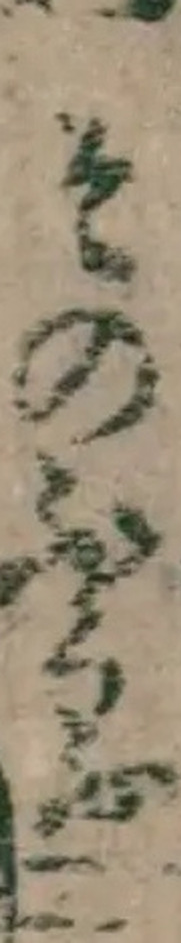そのふうふ
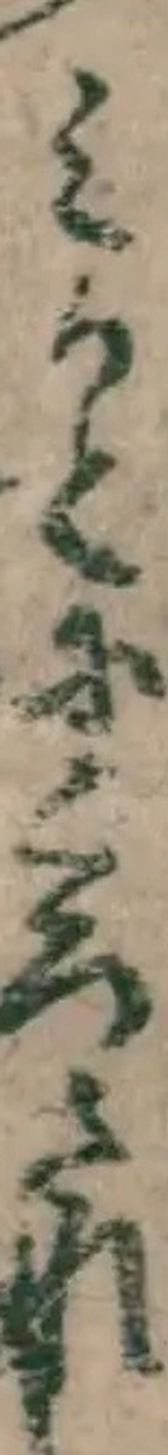みかとにころされ
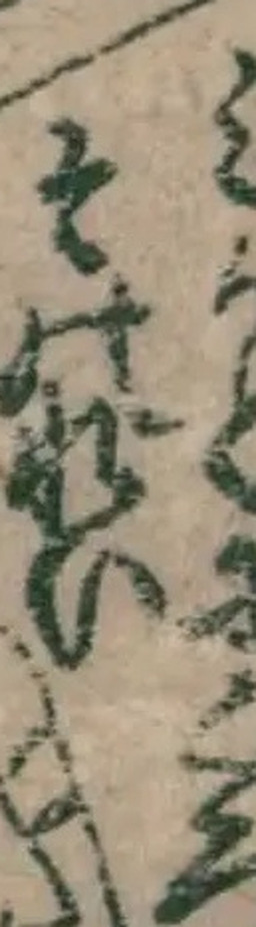そのれい
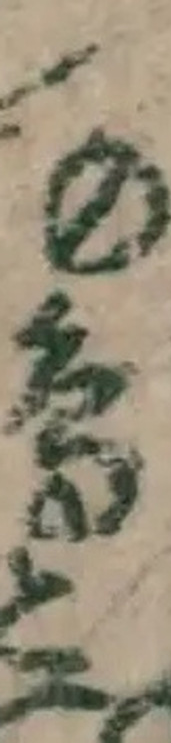の鳥と
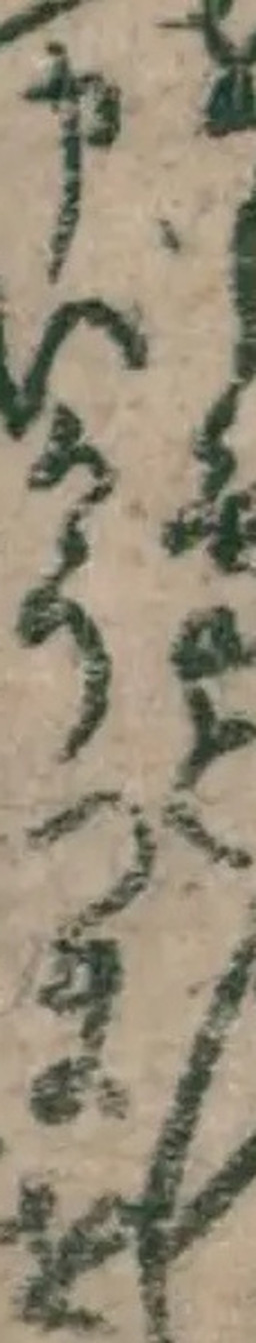申いかうつまを
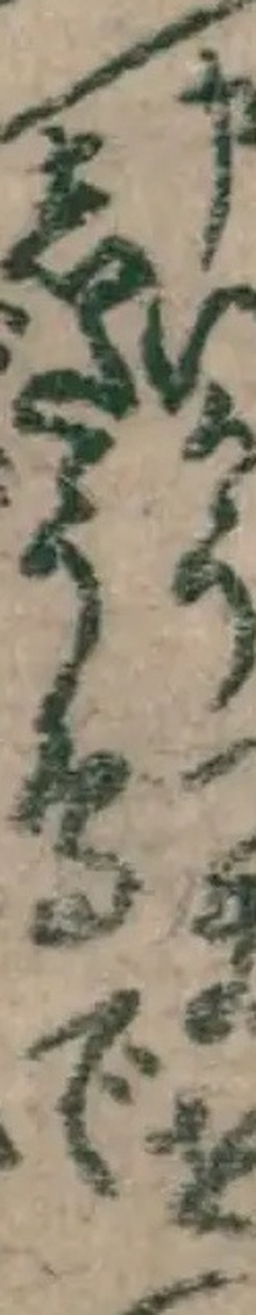したう鳥で
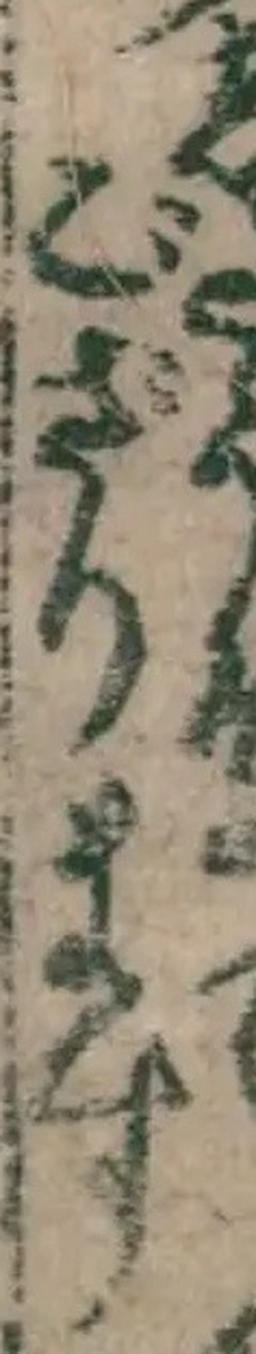ござります
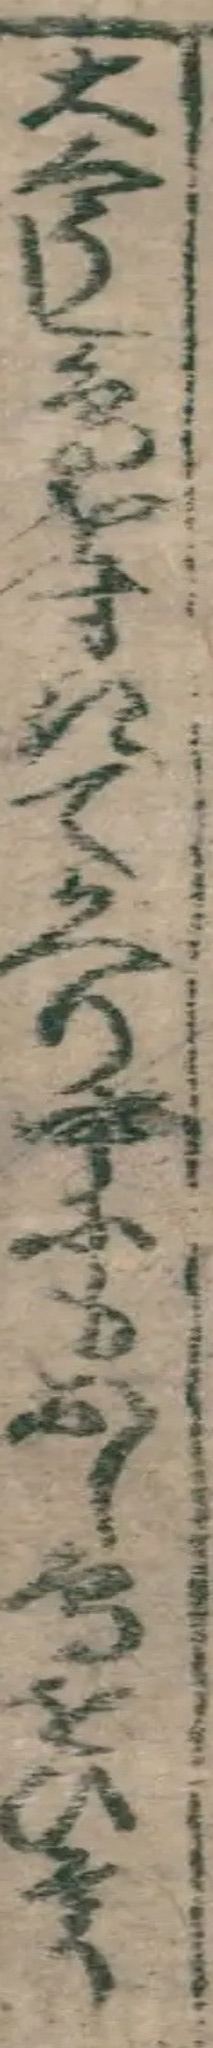大くうし鳥をすきてかへり中にもおし鳥をひそう
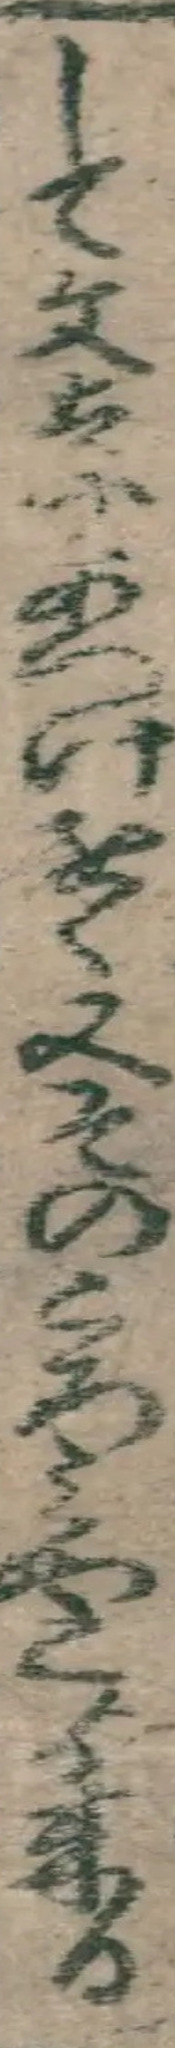して文太にあつけをく又そのころみやこより来る
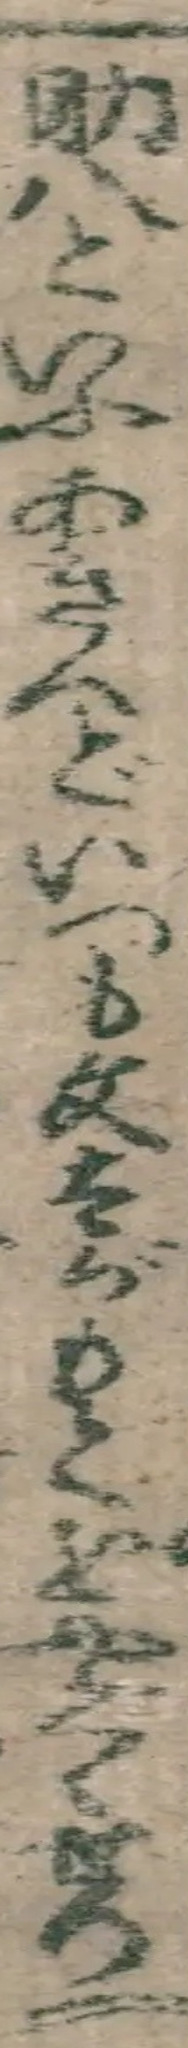助八といふあきんどいつも文太がもとをやどゝせり
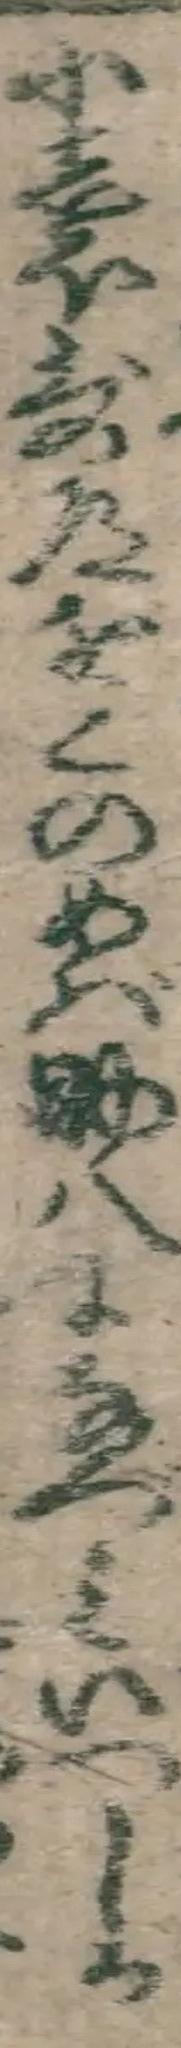小しほ哥道をこのめば助八になづみいつしか
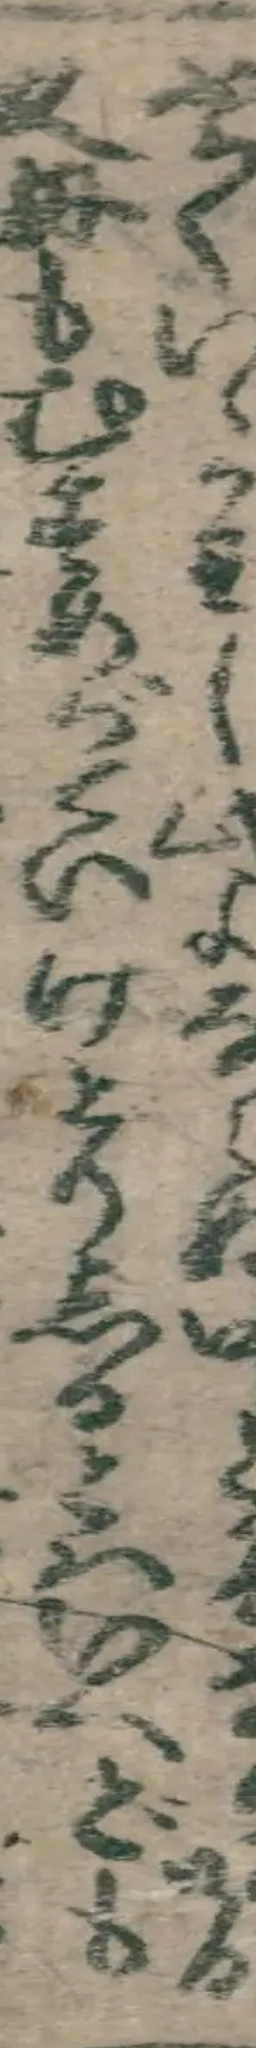父母もむすめがていけとりしるとはいへども
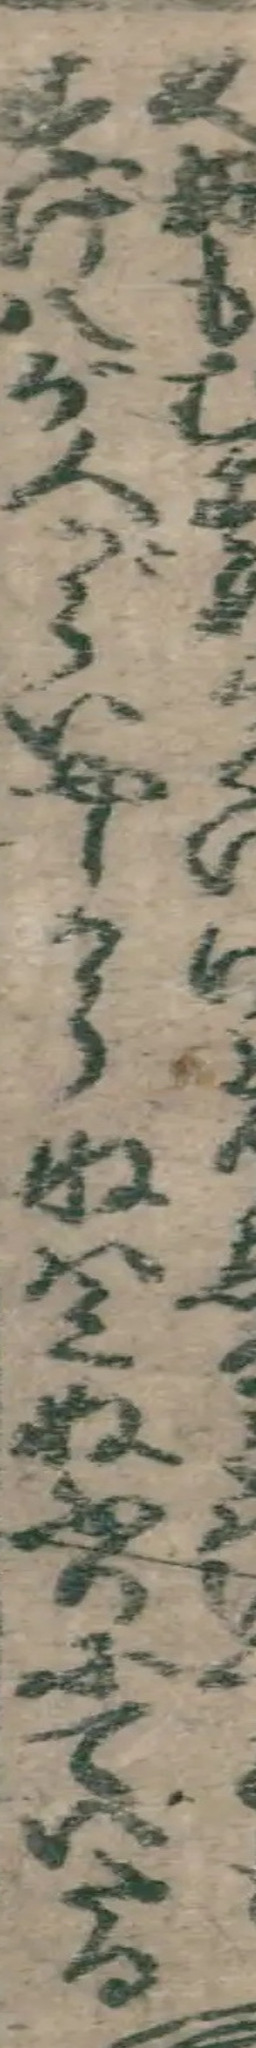すけ八が人がらいやしからねはみぬふりにていたる
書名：塩売文太物語 2巻
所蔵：国立国会図書館 National Diet Library, JAPAN
